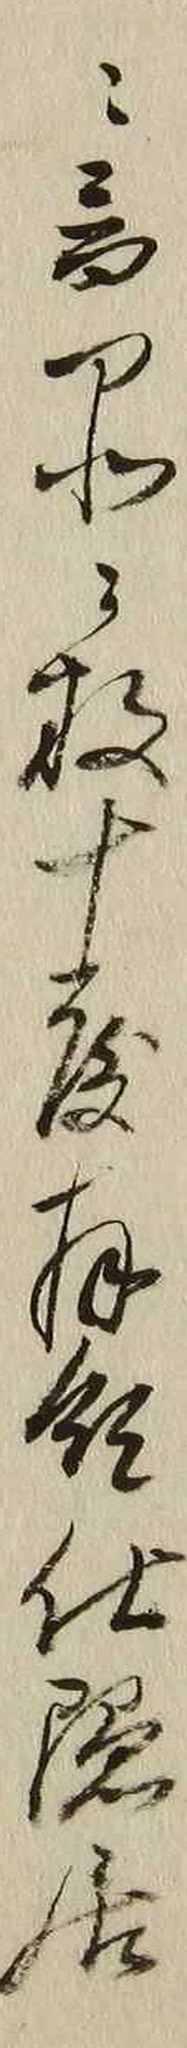々ニ而品々数十度拝領仕隠居
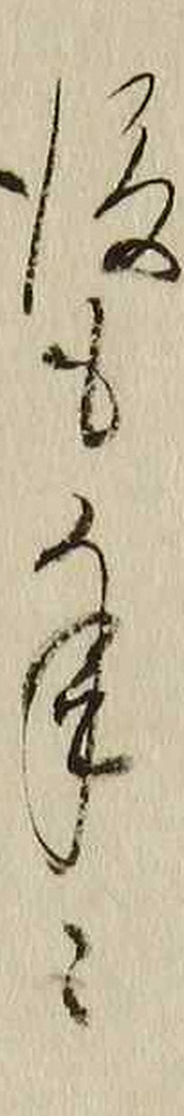後も年々
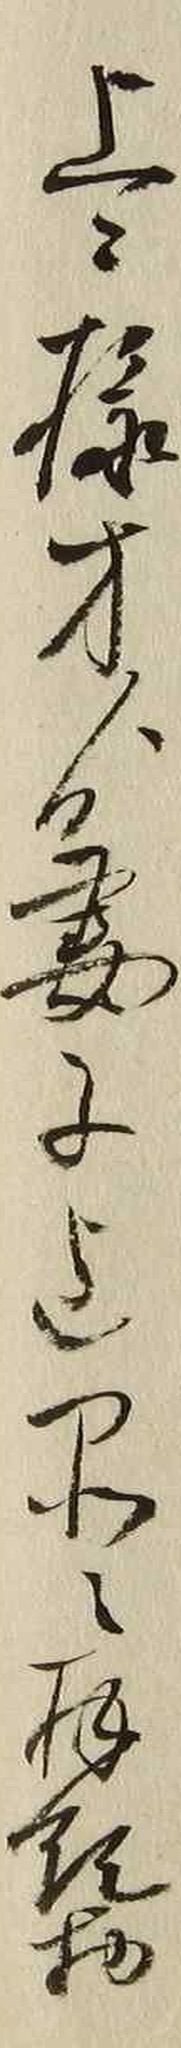上々様方ゟ妻子迄品々拝領物
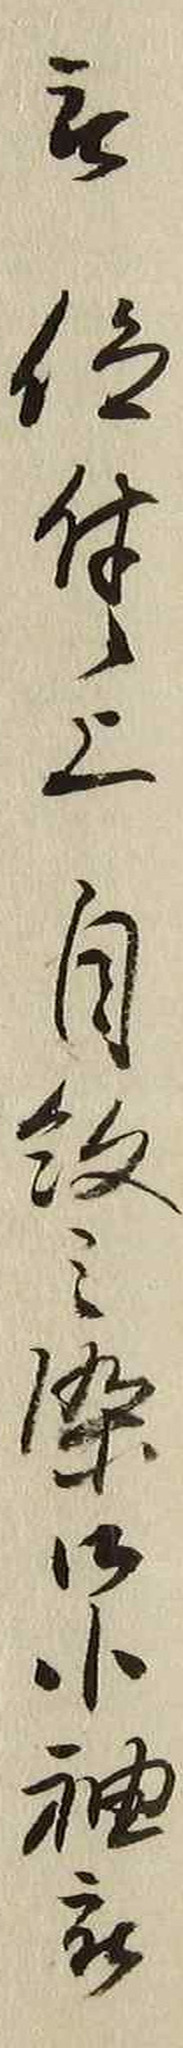被仰付候上自紋之染御小袖被
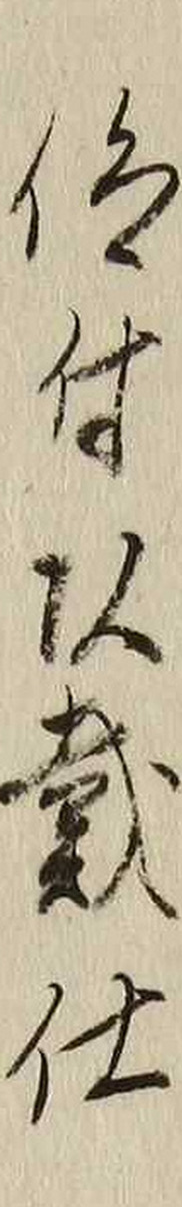仰付頂戴仕
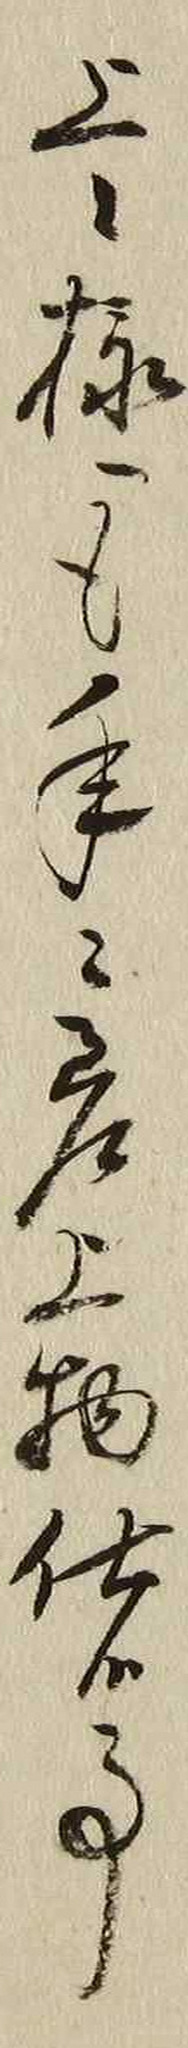上々様へも年々差上物仕候事
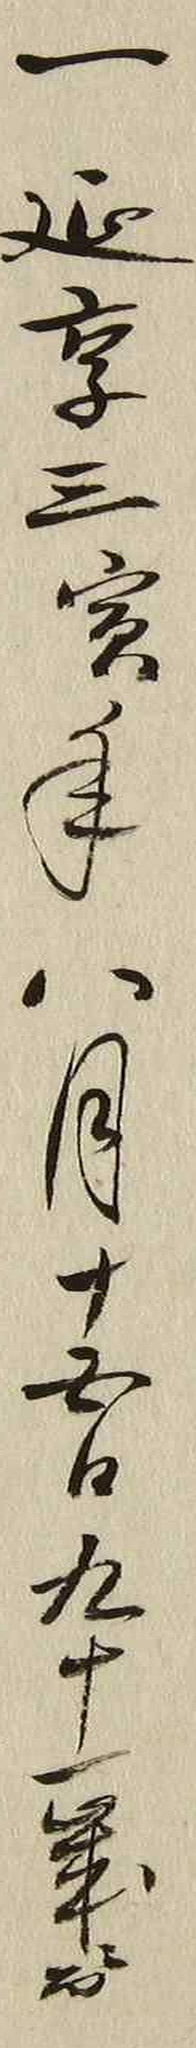一延享三寅年八月十五日九十一歳ニ而
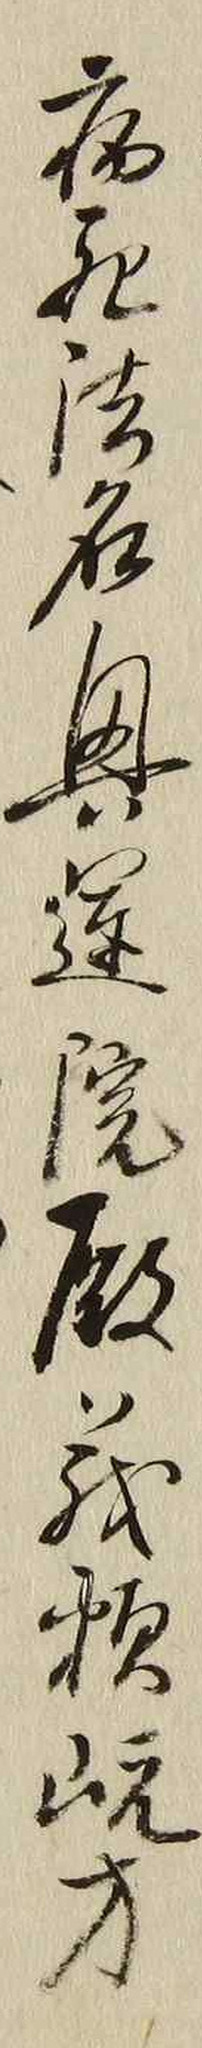病死法名興運院殿茂頼岏方
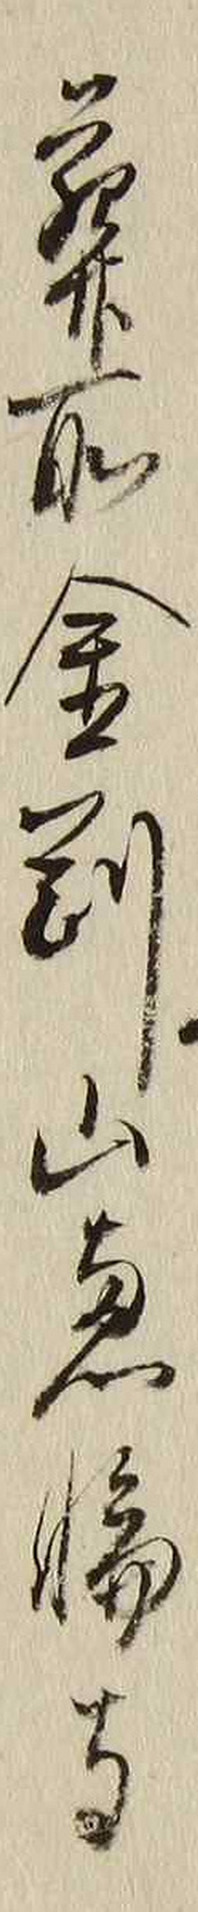葬所金剛山恵輪寺
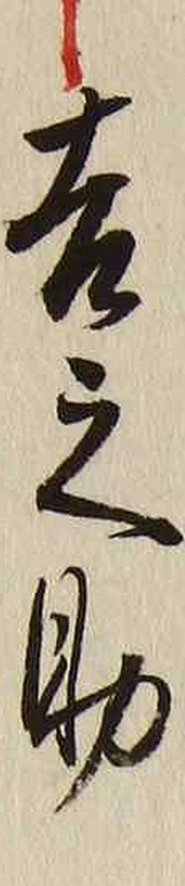吉之助
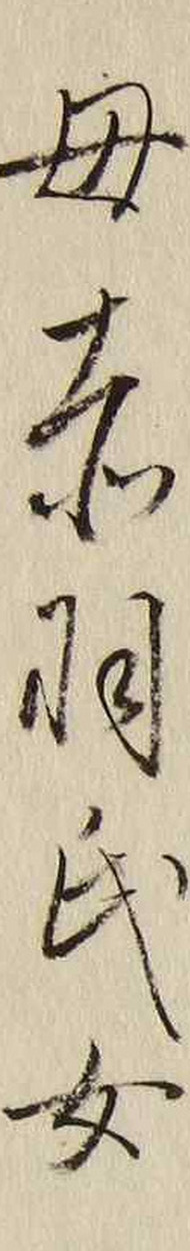母赤羽氏女

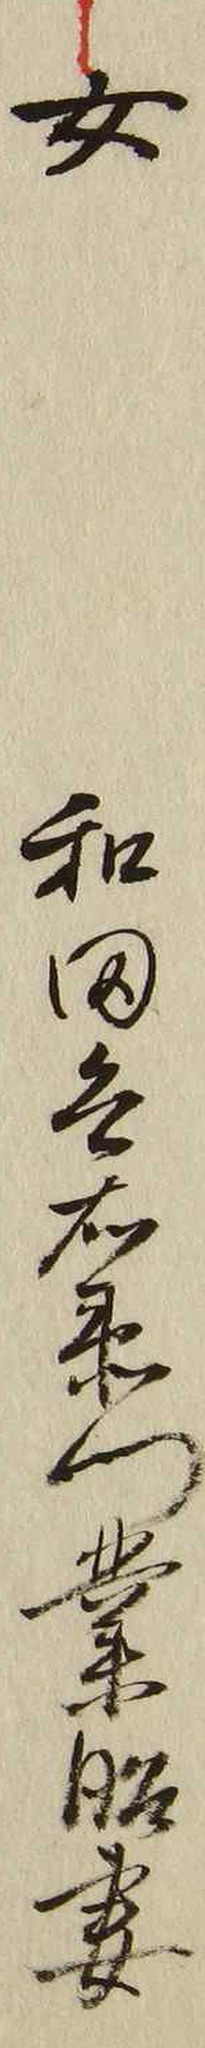女和田兵右衛門業昭妻
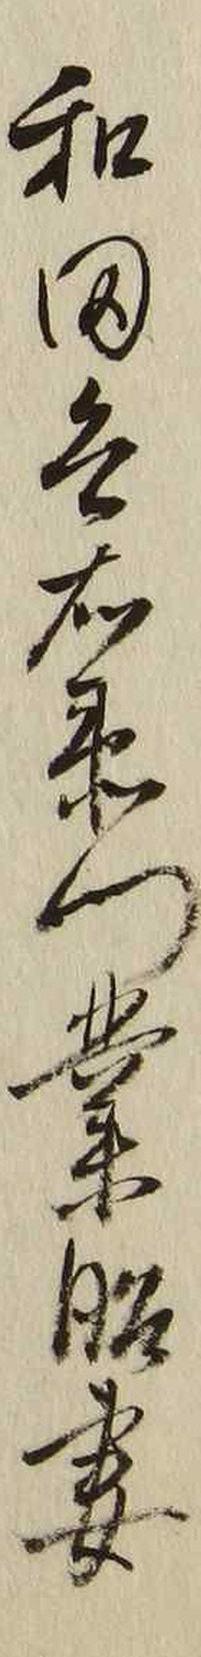女和田兵右衛門業昭妻
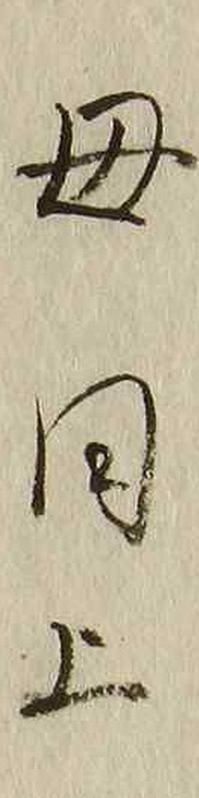母同上
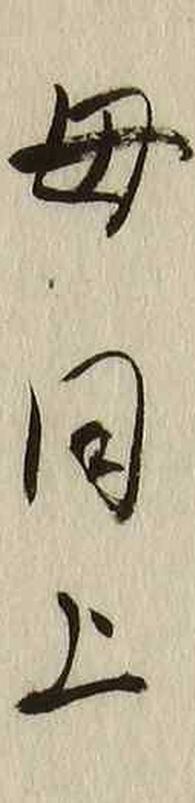母同上
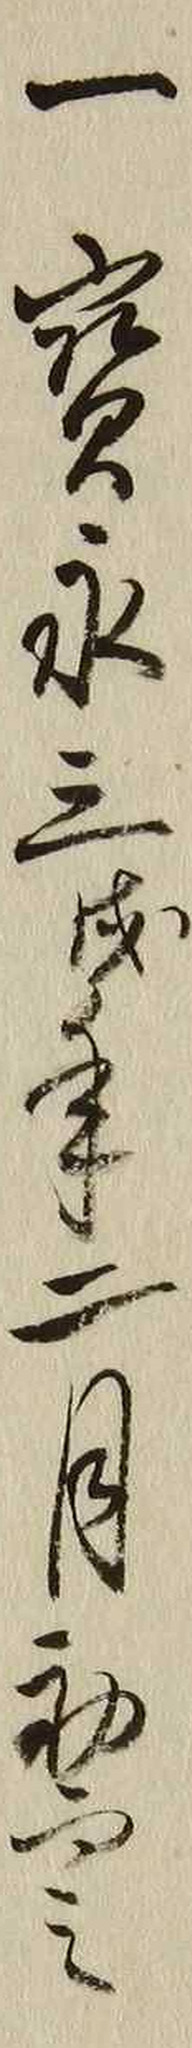一宝永三戌年二月初而之
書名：諸士系譜　巻之351　す之部1
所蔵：会津若松市立会津図書館
